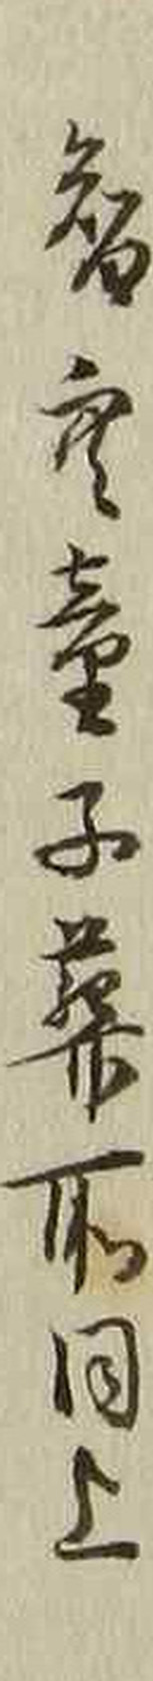智空童子葬所同上
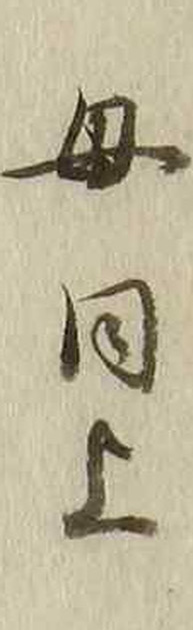母同上
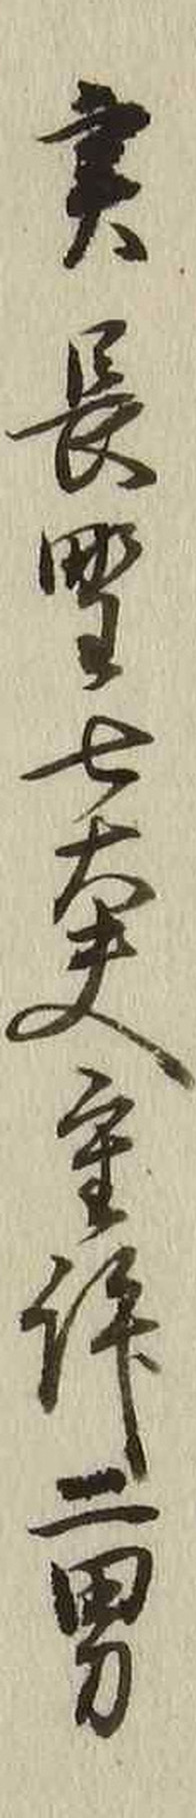実長野七太夫重許二男
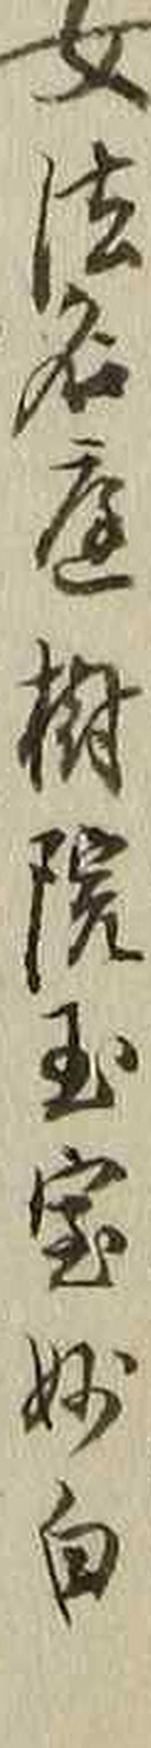法名庭樹院玉宝妙白
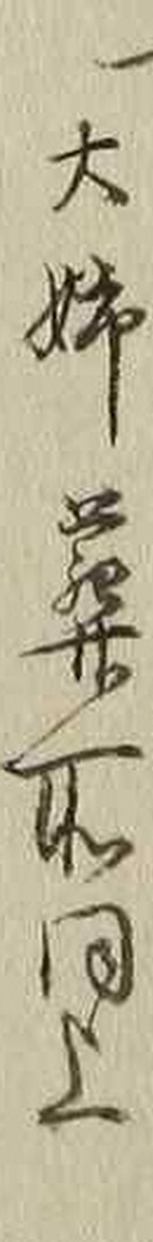大姉葬所同上
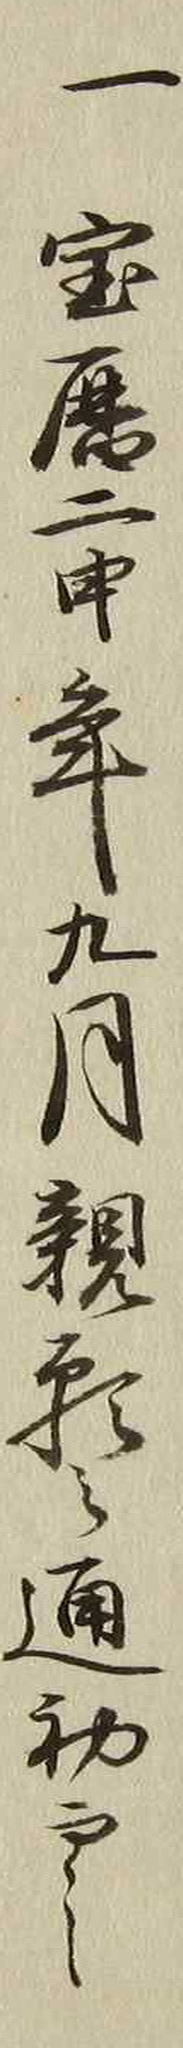一宝暦ニ申年九月親願之通初而之
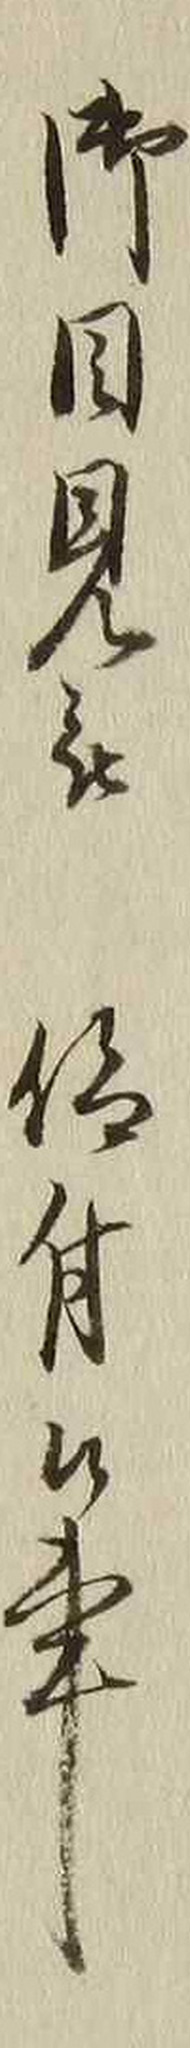御目見被仰付候事
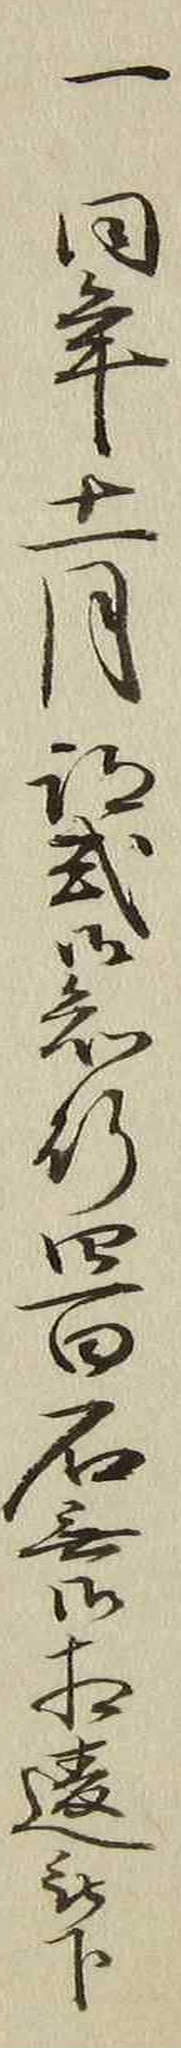一同年十一月跡式御知行四百石無御相違被下
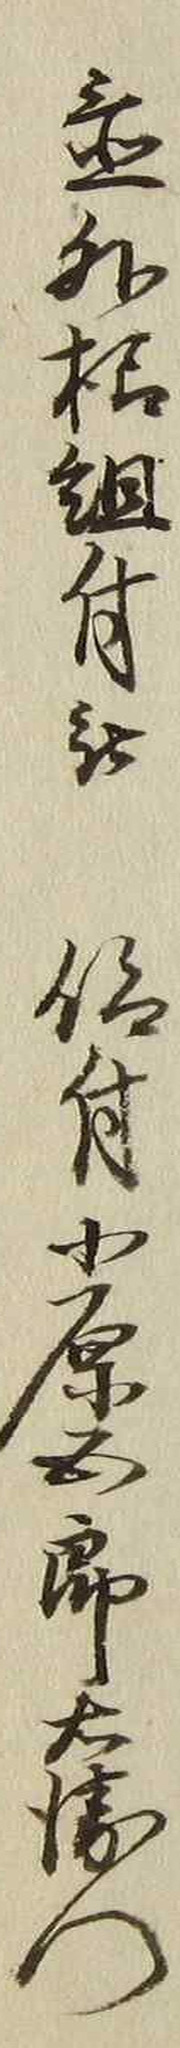置外様組付被仰付小原五郎右衛門
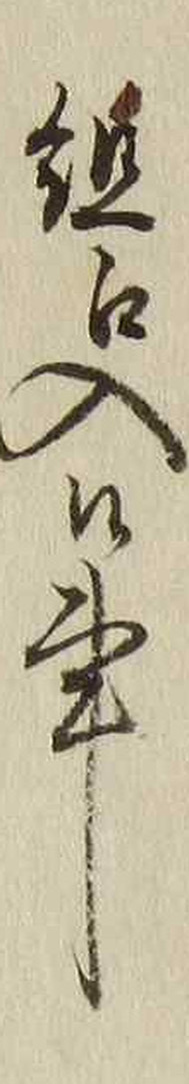組江入候事
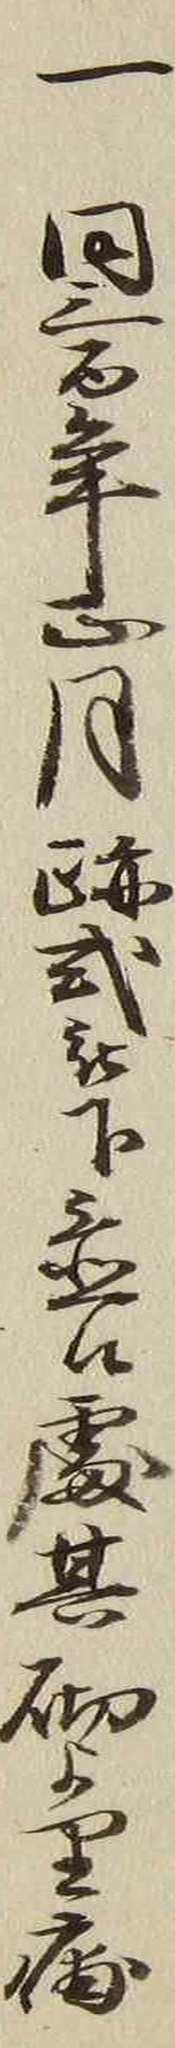一同三酉年正月跡式被下置候處其砌より痛
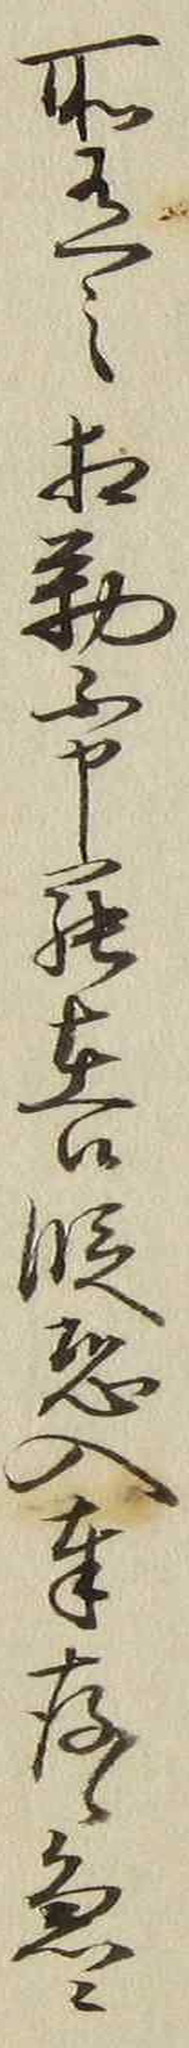所有之相勤ふ申罷在候段恐入奉存候急ニ
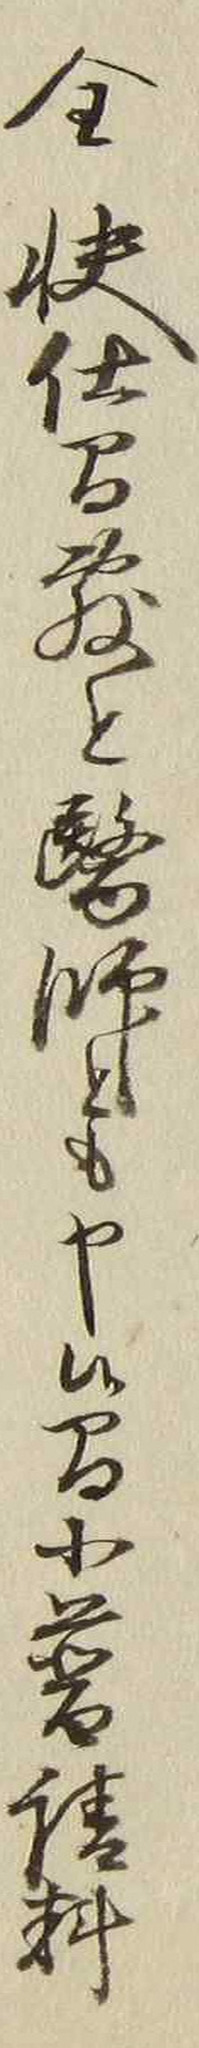全快仕間敷と医師とも申候間小普請料
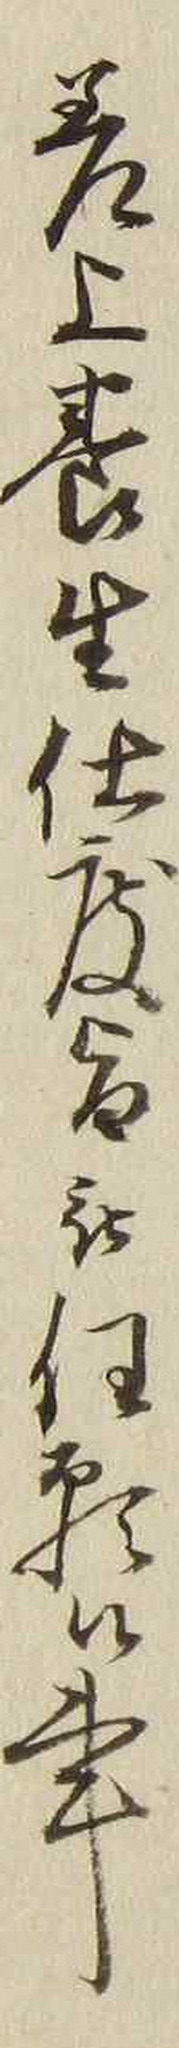差上養生仕度旨被伺願候事
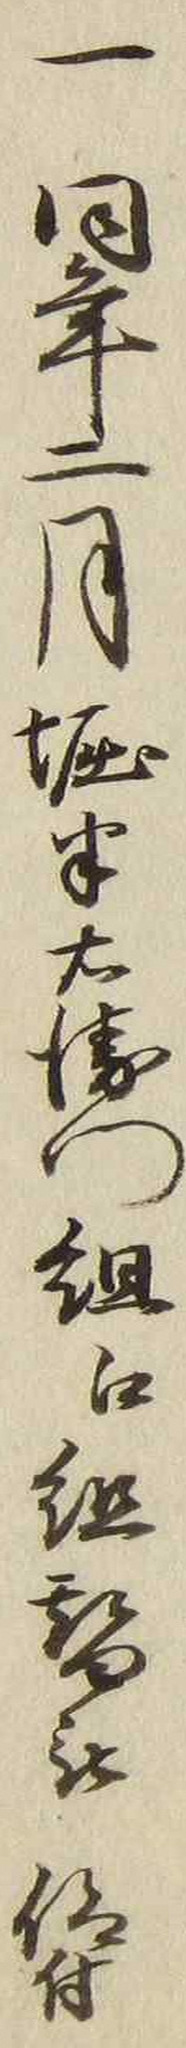一同年二月堀半右衛門組江組替被仰付

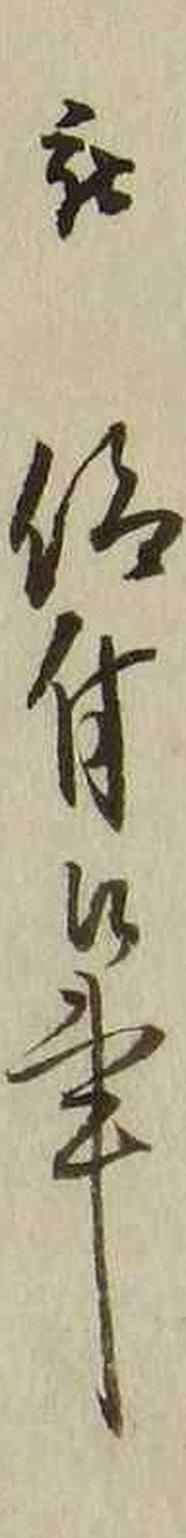被仰付候事
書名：諸士系譜　巻之114　か之部22
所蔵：会津若松市立会津図書館
